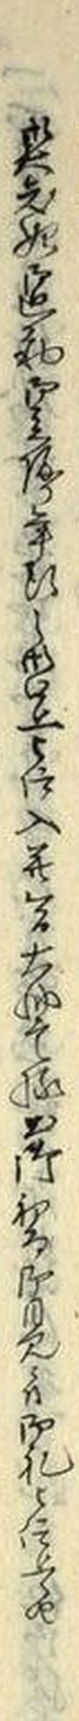御大老始御廻勤御立帰り年頭之御口上被仰入幷今日大納言様出御初而御目見ニ付御礼被仰上候由
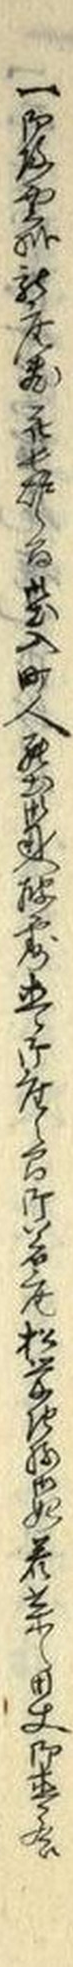一御帰殿掛新座敷幷長炉之間御出入町人罷出御用人披露直ニ御座之間御着座松栄院様御始若菜之御使御直答
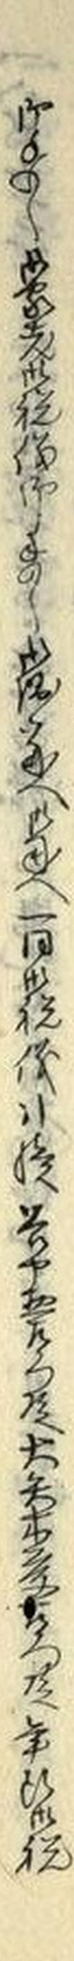御手のし御家老御祝儀御手のし御側御用人御用人一同御祝儀引続谷中惣左衛門殿大矢木藤左衛門殿年頭御祝
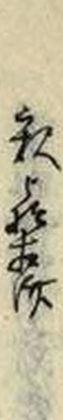釈被遊相済
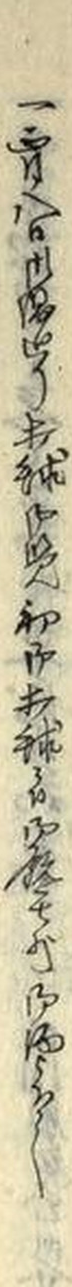一正月八日御側廻り打毬御覧初御打毬ニ付御厩其外御酒被下之
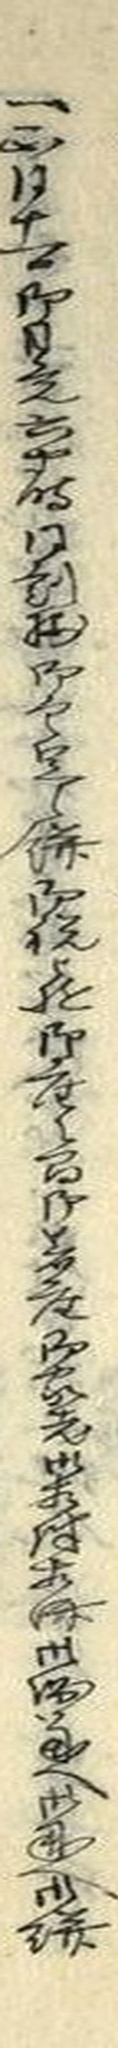一正月十一日御目覚六半時同刻揃御具足之餅御祝被遊御座之間御着座御家老御相伴相済御側御用人御用人御餅
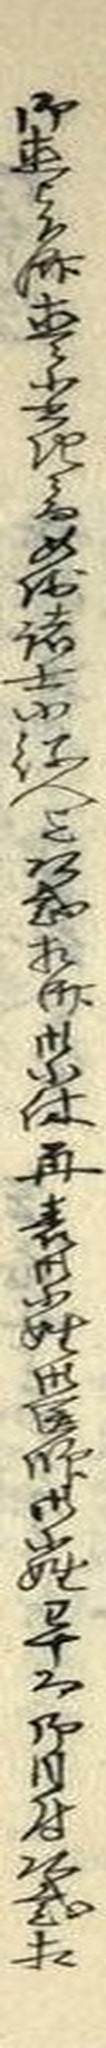御直被下済直ニ小書院ニ而如例諸士小役人迄頂戴相済御小休再表御小姓御医師御小姓畢而御目付頂戴相
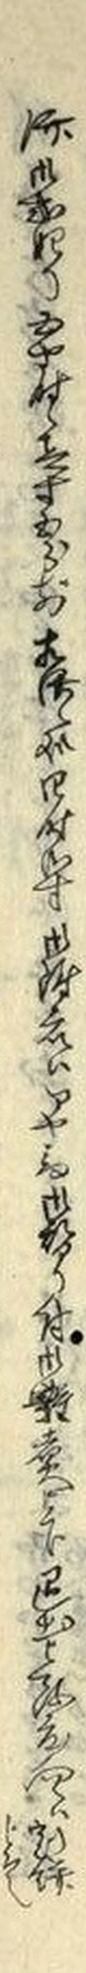済御式始り五半時へ壱寸五分前相済候処四時弐寸御附衆ハ部屋ニ而御替り付御雑煮被下退出被致度向ヘハ割餅被下之
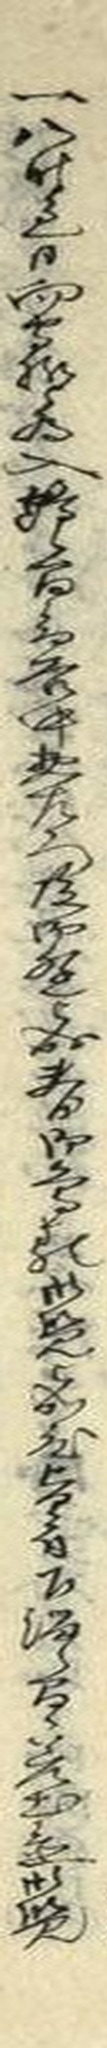一八時過日向守様被為入鶴之間ニ而谷中惣左衛門殿御逢被成夫ゟ御鳥類御覧被成度旨ニ付下溜之間へ差出置御覧
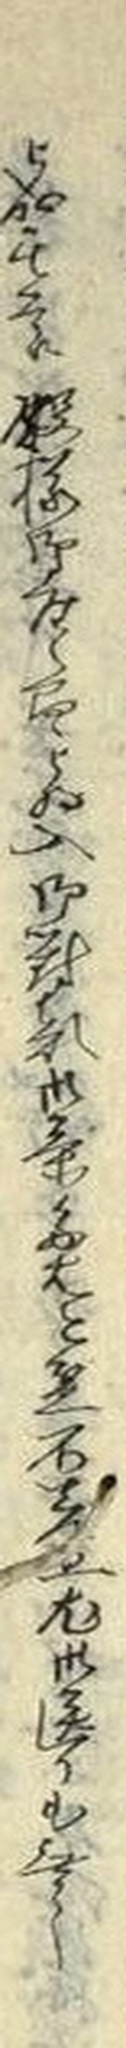被成其節殿様御座之間へ被為入御対顔御茶たはこ盆不差上尤御送りも無之
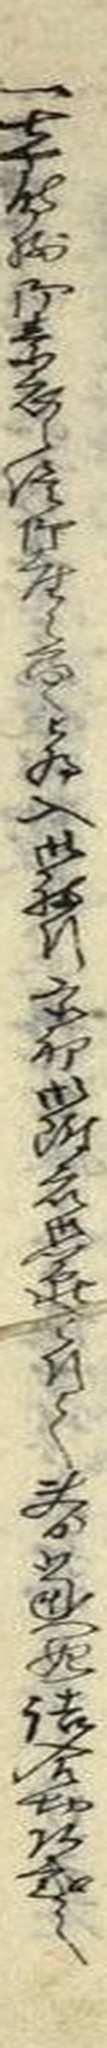一七半時揃御素衣之儘御座之間へ被為入御福引最初御附衆御鬮被引之夫ゟ御用人始詰合切頂戴之
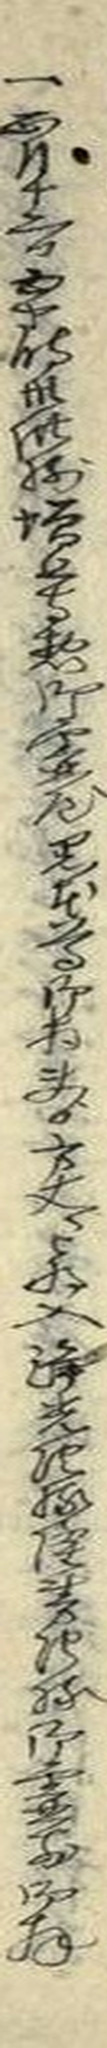一正月十二日五半時御供揃増上寺惣御霊屋黒本尊御拝夫ゟ方丈へ被為入浄光院様隆芳院様御霊前御拝

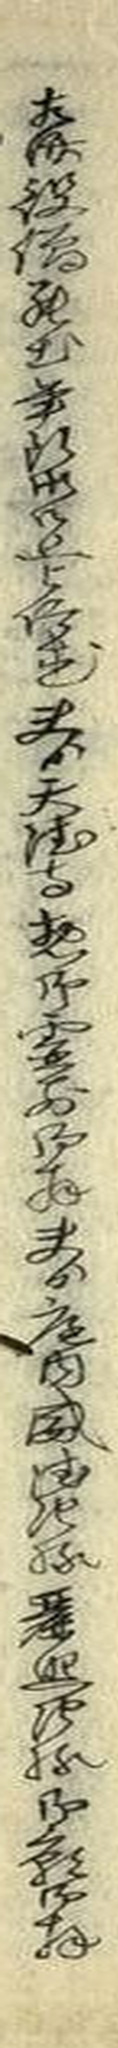相済役僧罷出年頭御口上被仰述夫ゟ天徳寺惣御霊前御拝夫ゟ庭内威徳院様麗照院様御廟御拝
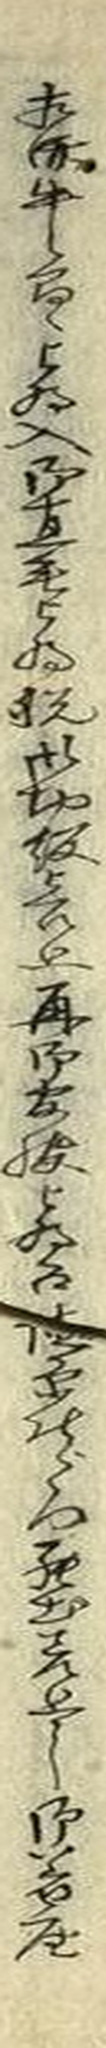相済牛之間へ被為入御直垂被為脱御切飯被召上再御官服被為召埴原次郎右衛門罷出差上之御着座
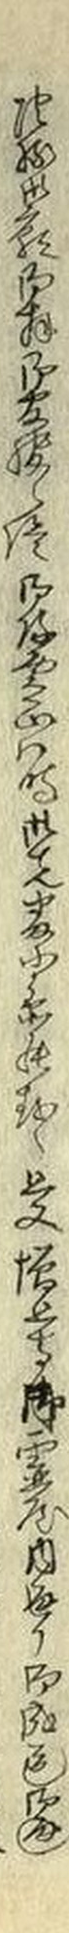院様御廟御拝御官服之儘御帰殿正八時御先番小兵衛罷越候且又増上寺御霊屋内通り御成道御通
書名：少傅日録抄（斉善付側向頭取日記、在府）
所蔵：福井県文書館 Fukui Prefectural Archives
